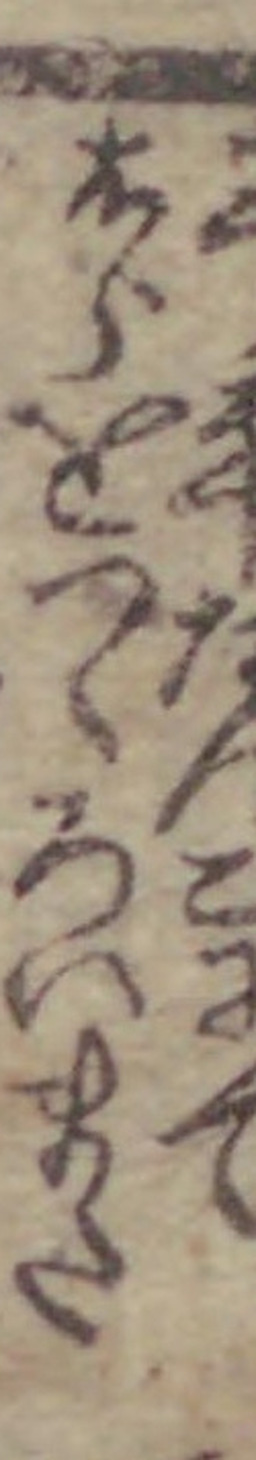はらをつくろいまた
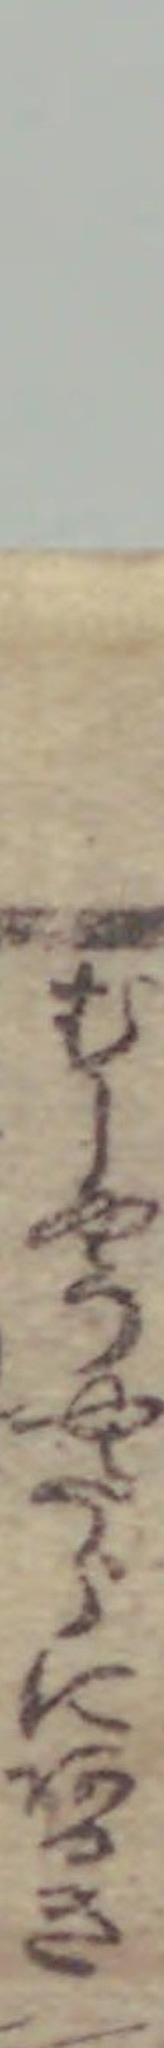むしやうやたらにあるき
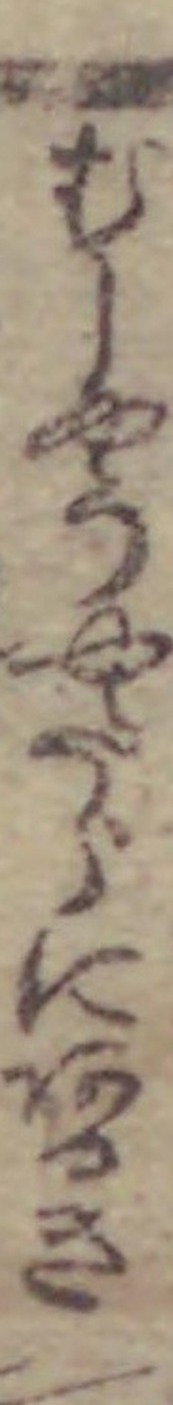むしやうやたらにあるき
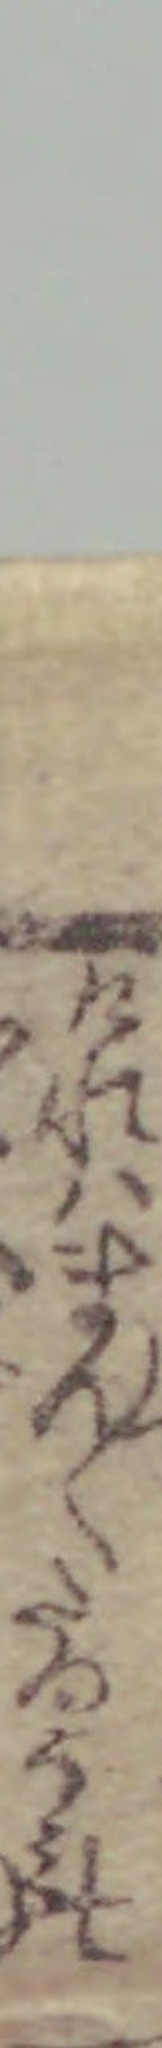けれはまん〳〵たるうみの
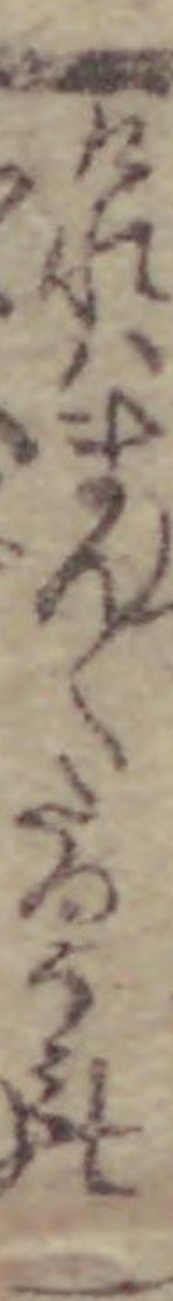けれはまん〳〵たるうみの
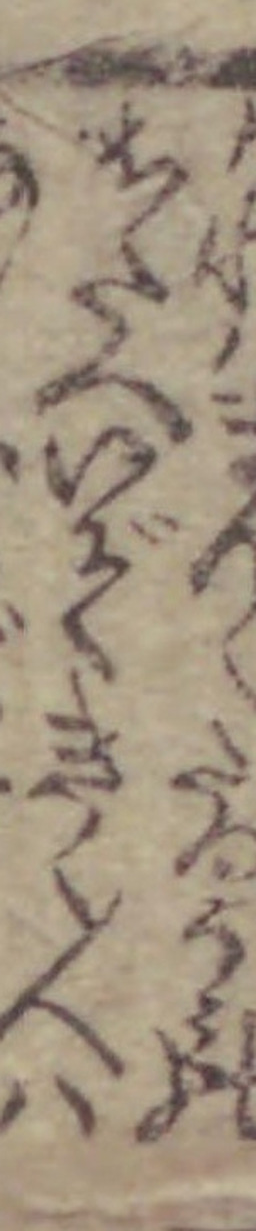はたへいできく人は
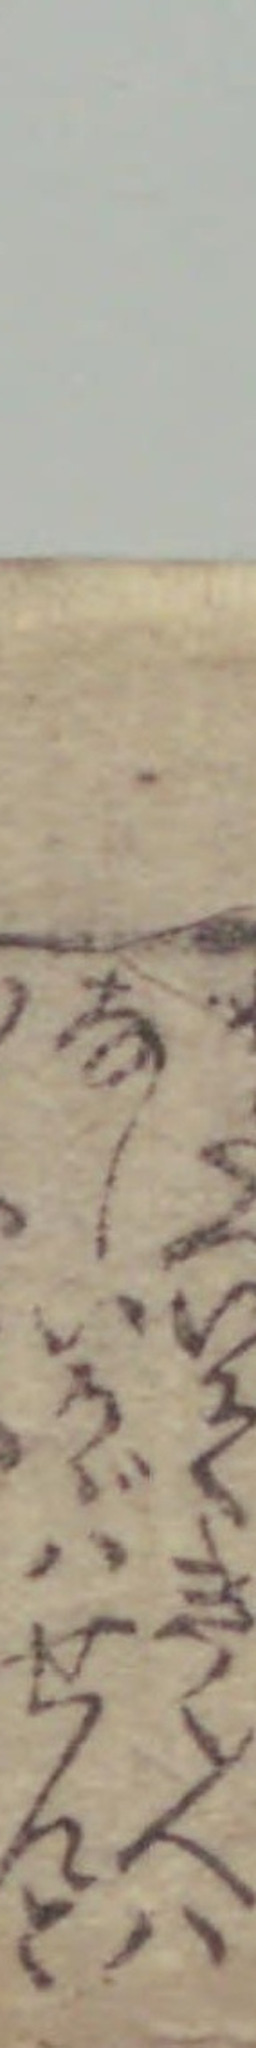なしいかゞはせんと
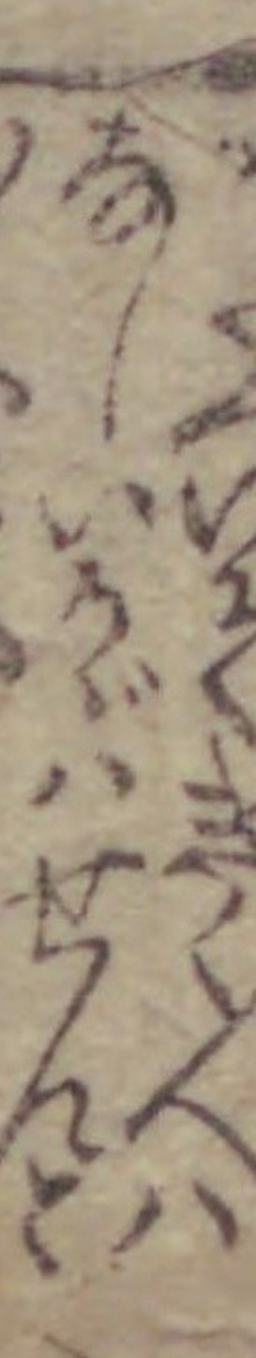なしいかゞはせんと
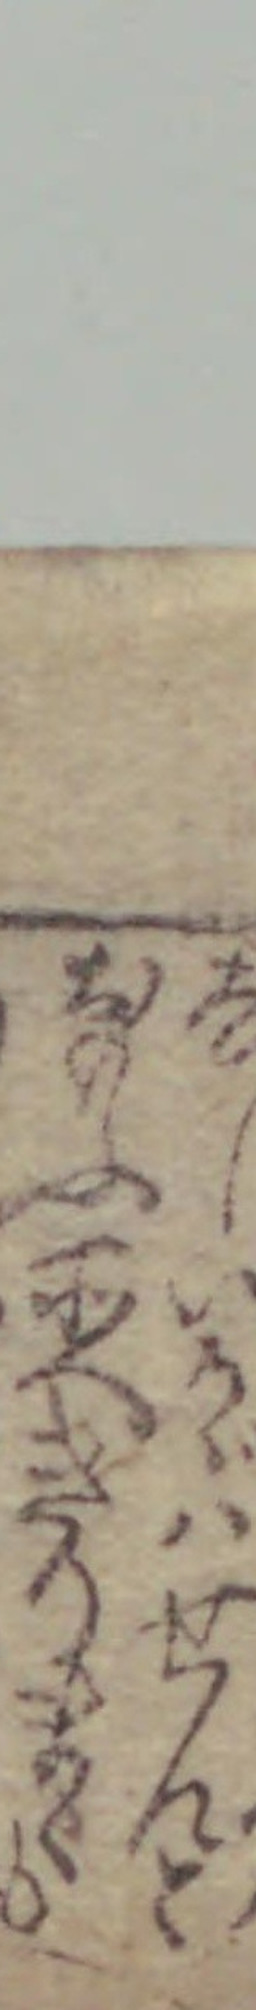おもふ所へきりまくも
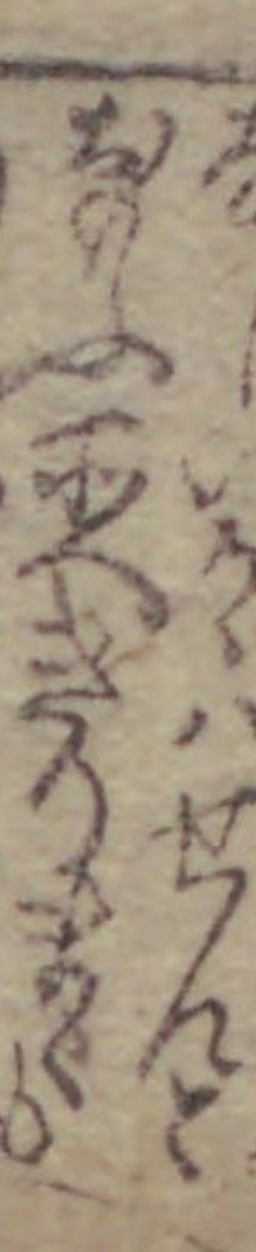おもふ所へきりまくも
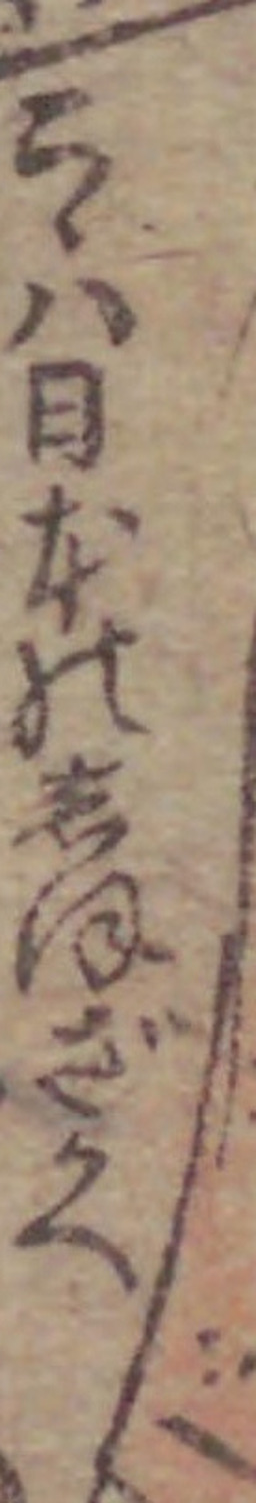こゝは日本のしほさかへ
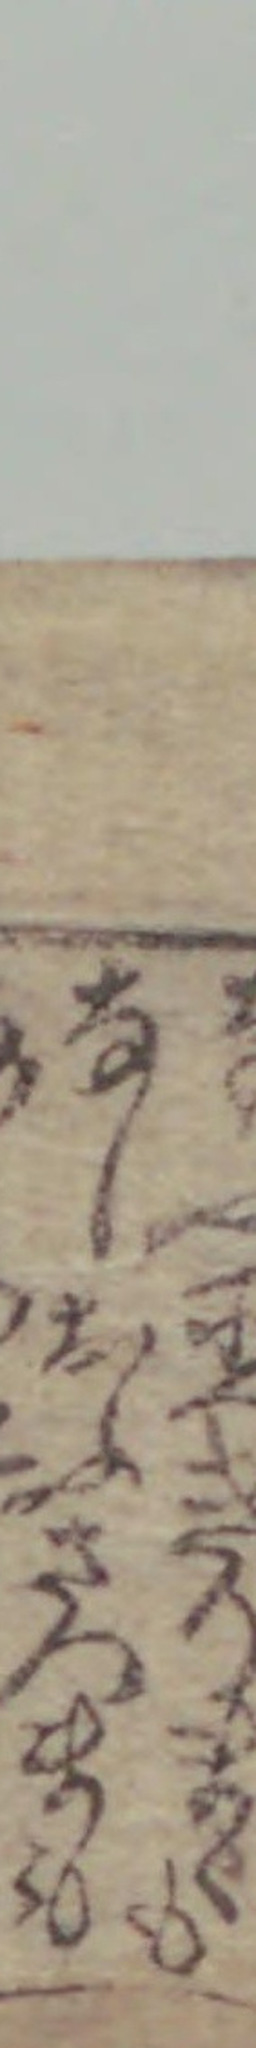なしおふさつまも
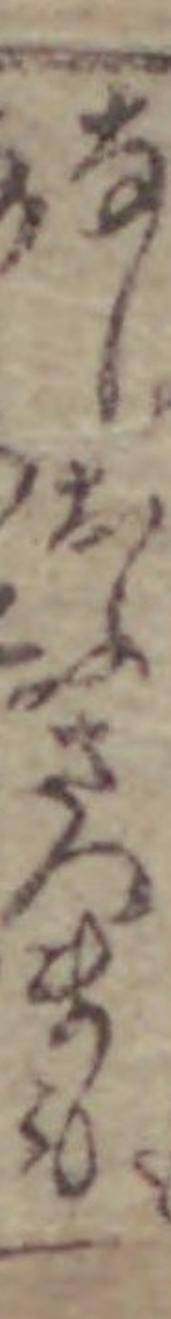なしおふさつまも
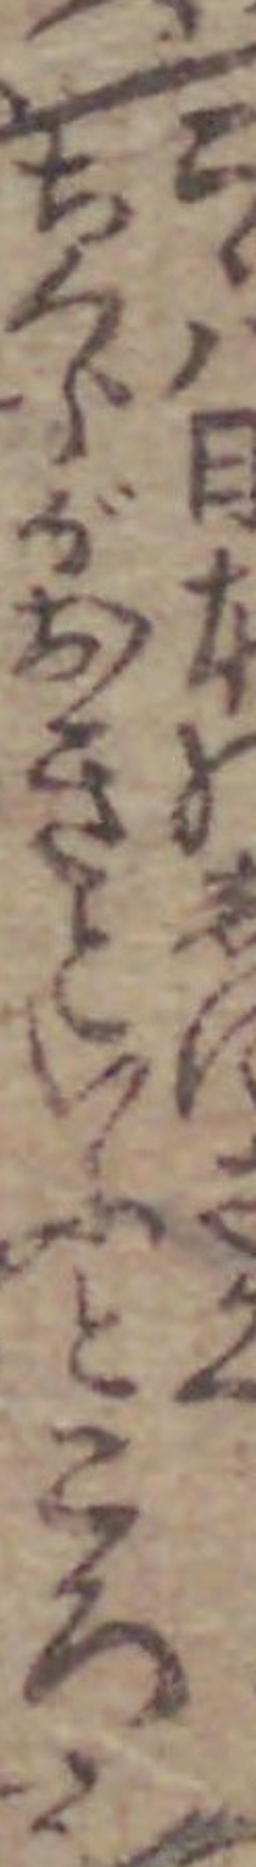ちくらがおきといふところ也
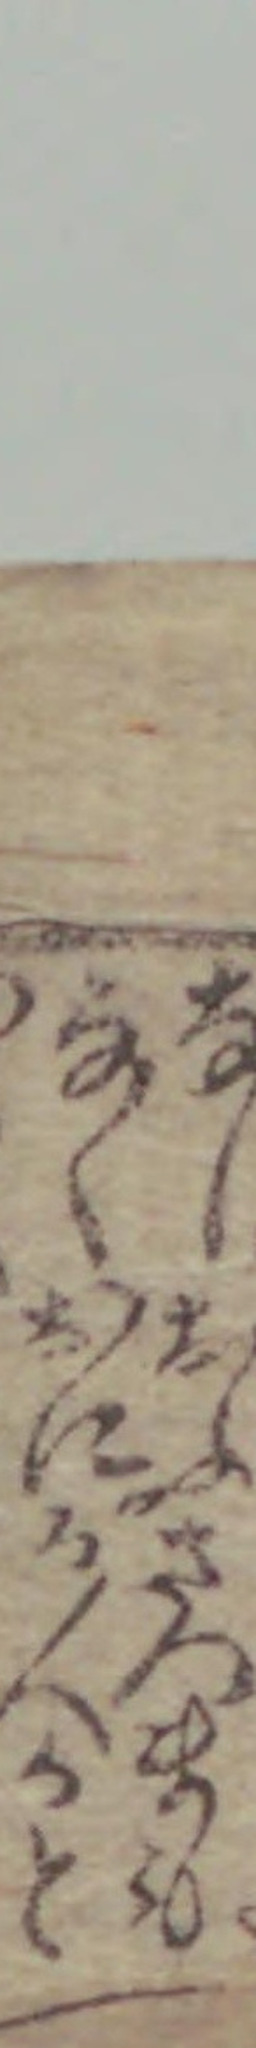なくおにか人かと
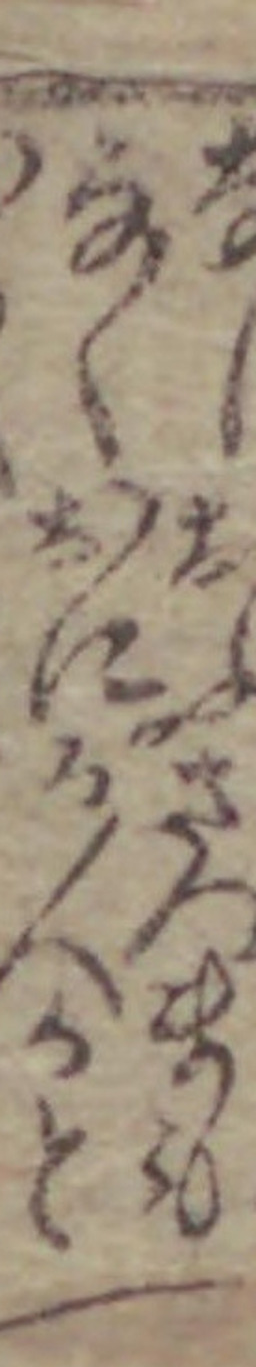なくおにか人かと
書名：近頃嶋めぐり 3巻
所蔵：国立国会図書館 National Diet Library, JAPAN
